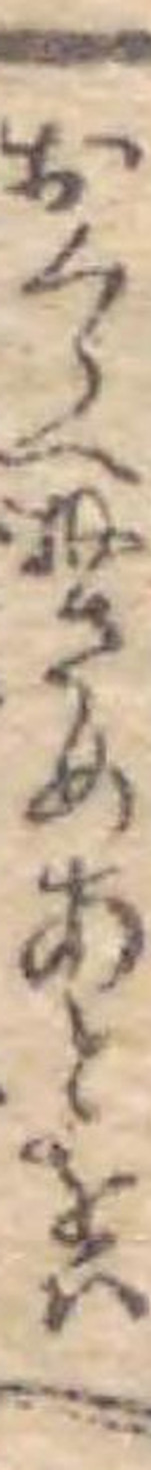おくらへおさめあとをは
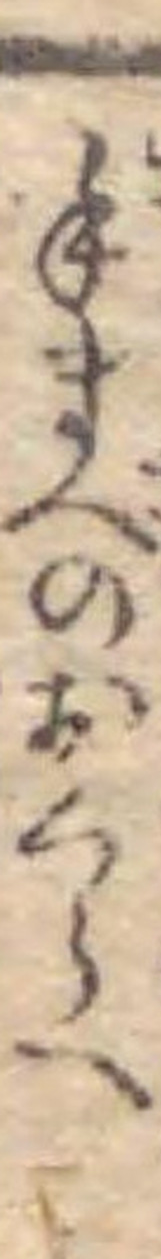手まへのおくらへ
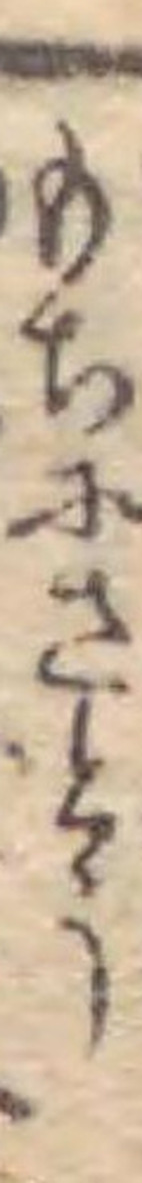もちにさとう
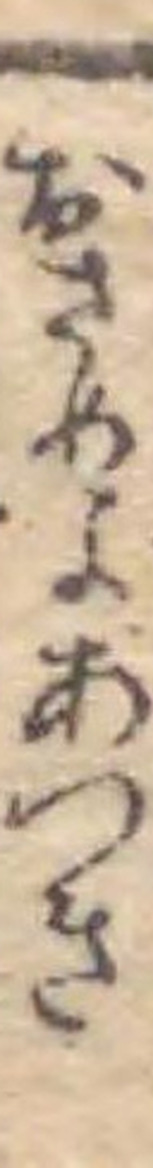おさめよあつき
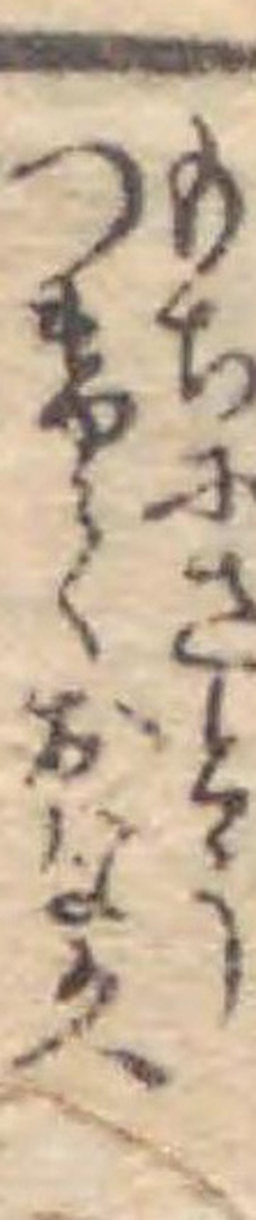つけておなかへ
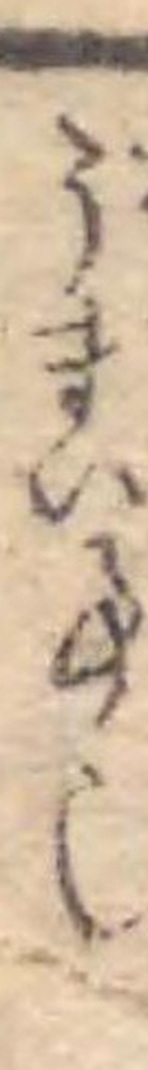うまい事也
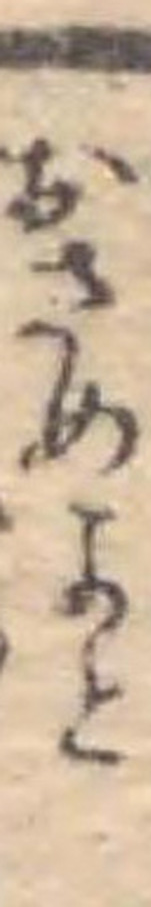おさめよと
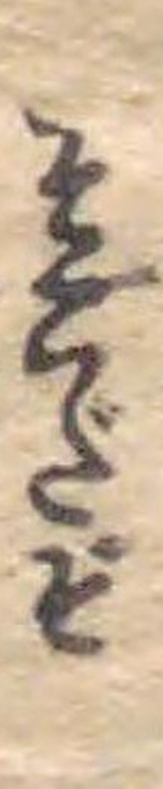そこだぞ
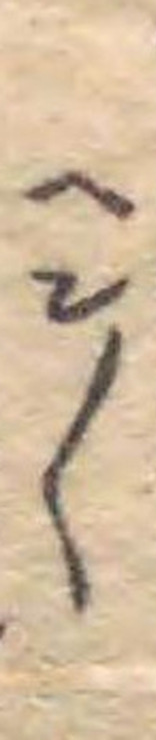ヘン〳〵
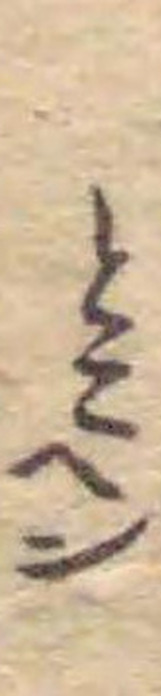とこヘン
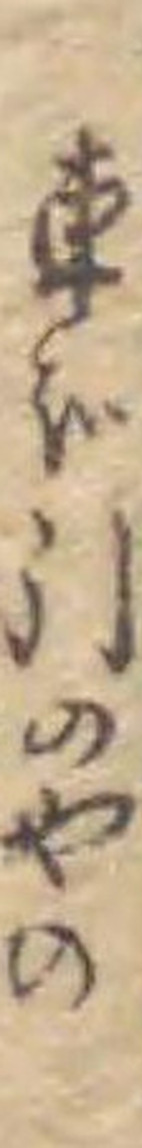車引のやの
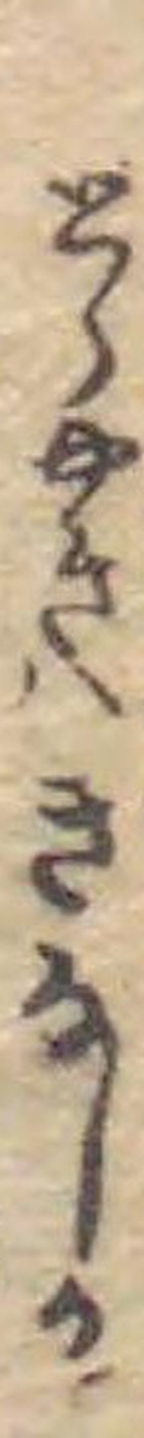とらやきはきなしか
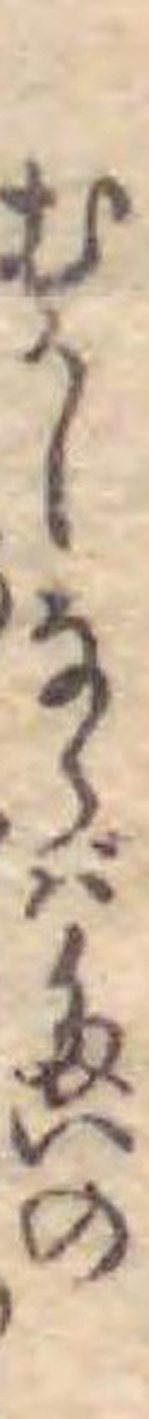むかしならばたいの
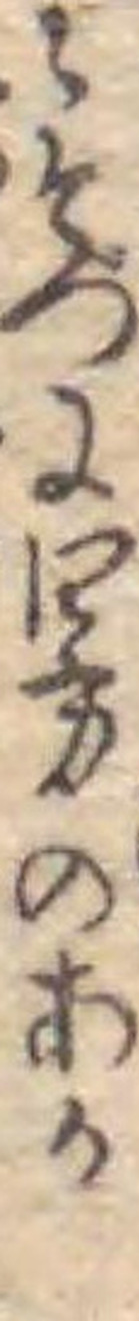みそづに四方のあか
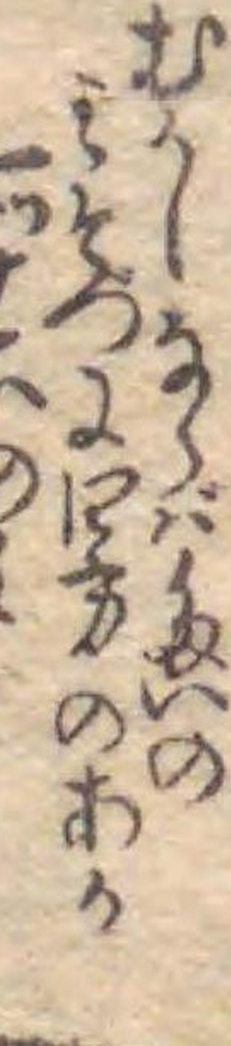みそづに四方のあか
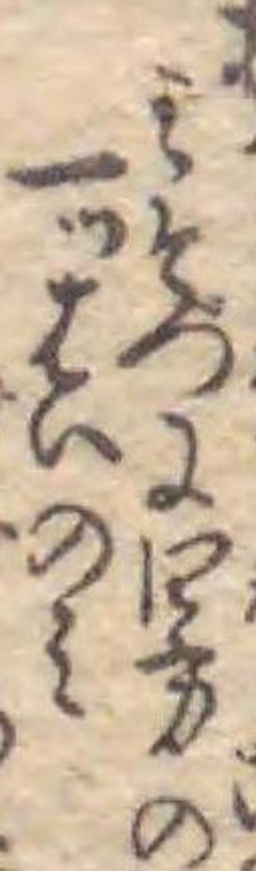一ッはいのみ
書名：悦贔負蝦夷押領 : 3巻
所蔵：国立国会図書館 National Diet Library, JAPAN
